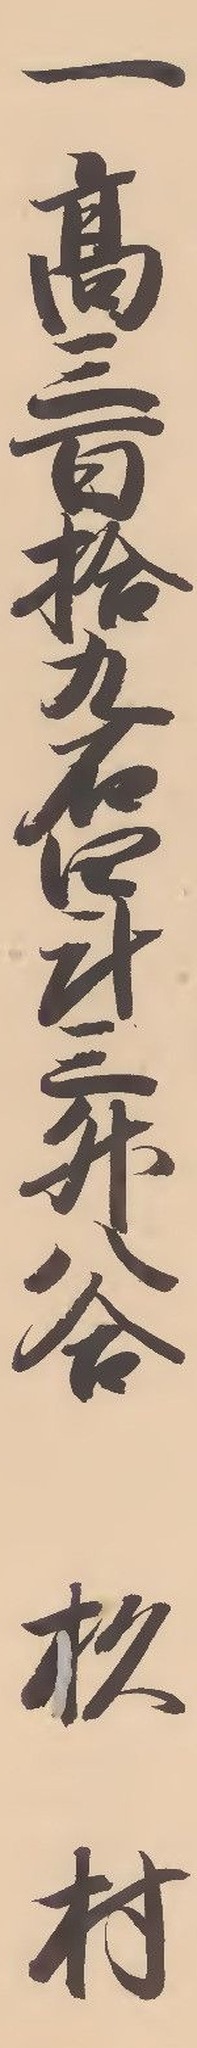一高三百拾九石四斗三升八合杉村

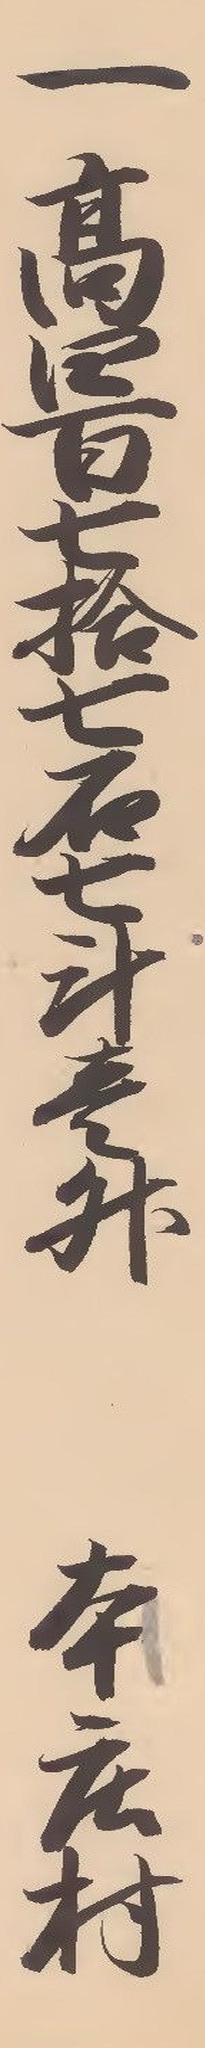一高四百七拾七石七斗壱升本庄村
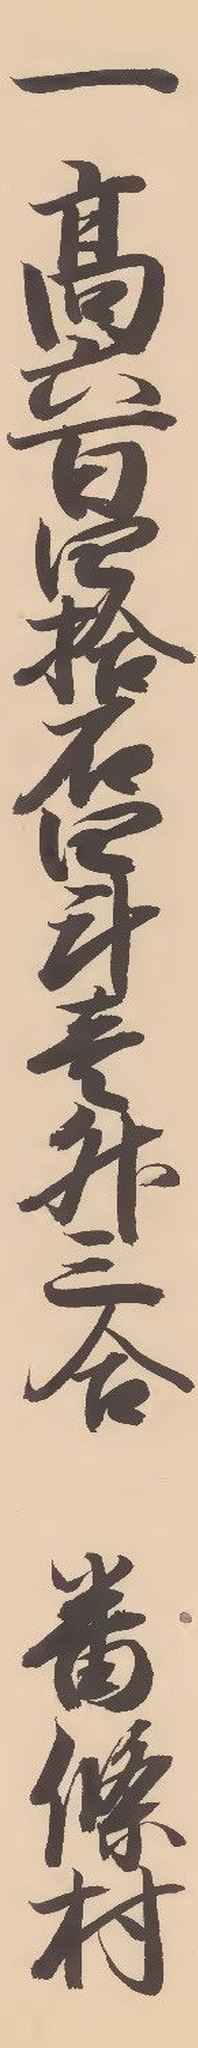一高六百四拾石四斗壱升三合番条村
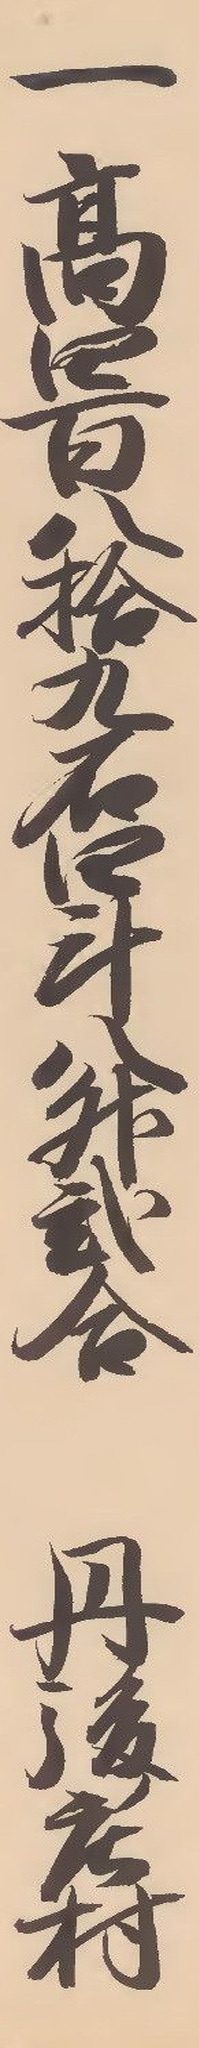一高四百八拾九石四斗八升弐合丹後ノ庄村
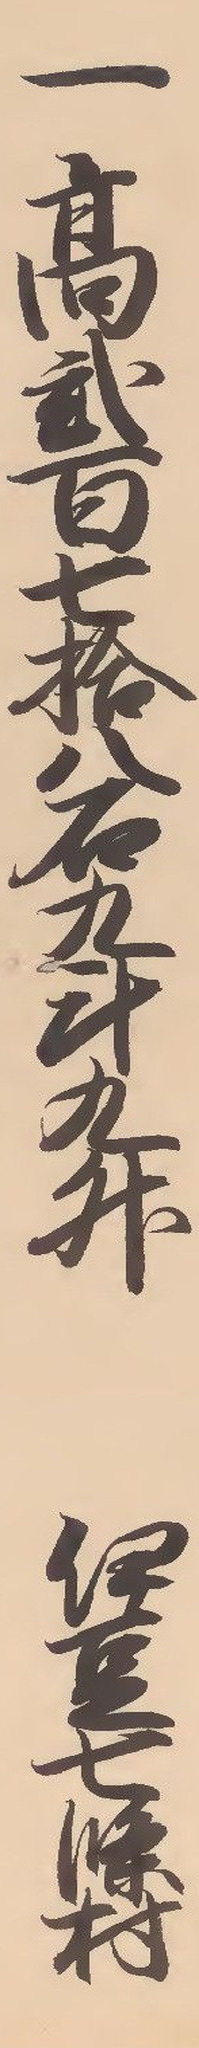一高弐百七拾八石九斗九升伊豆七条村
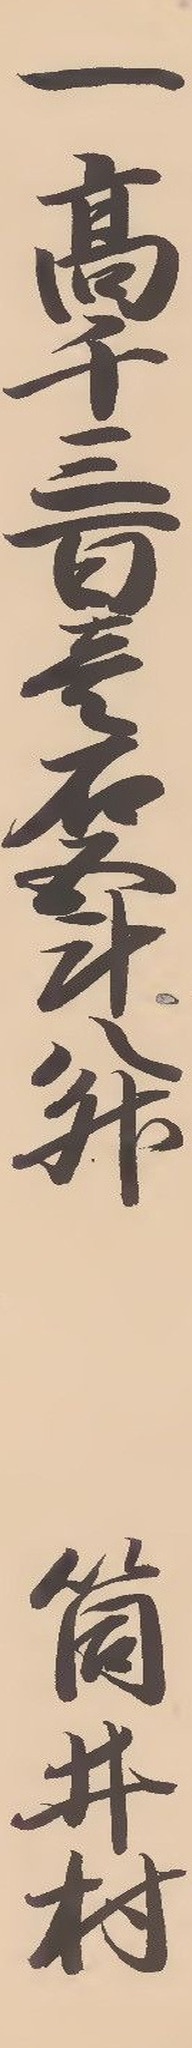一高千三百壱石五斗八升筒井村
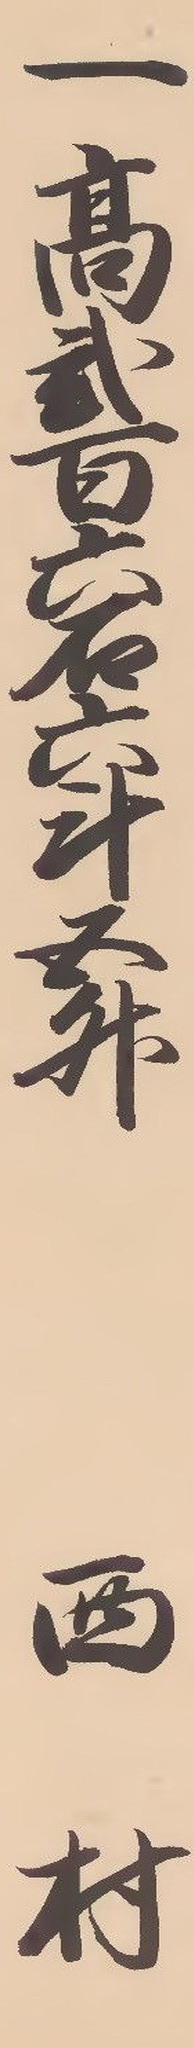一高弐百六石六斗五升西村
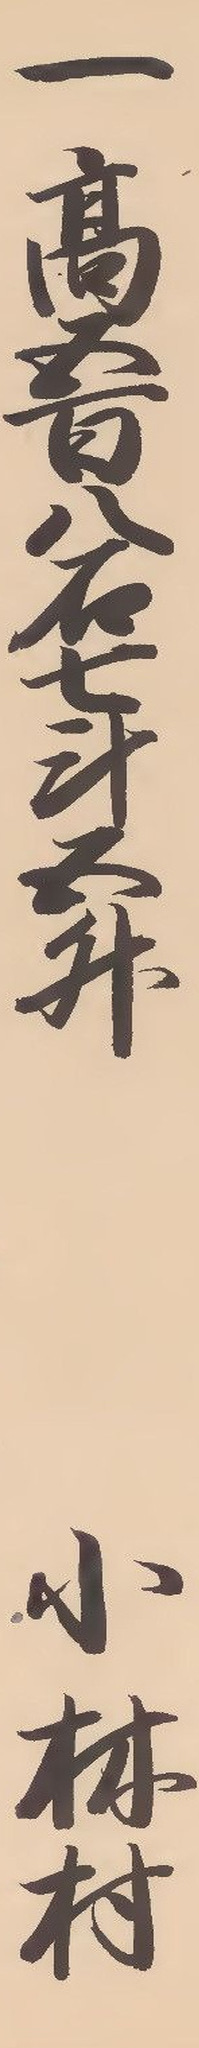一高五百八石七斗五升小林村
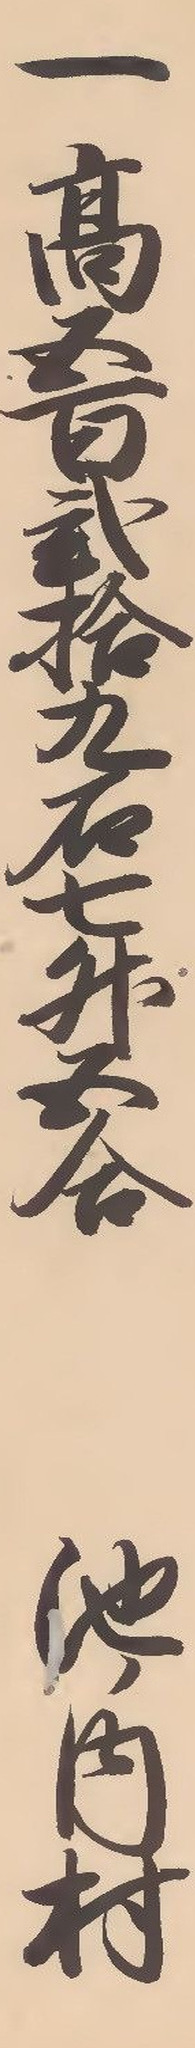一高五百弐拾九石七升五合池ノ内村

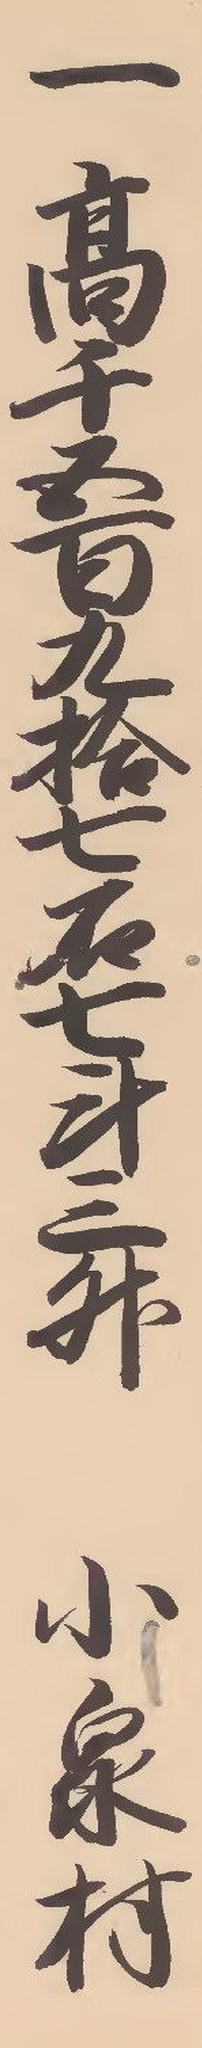一高千五百九拾七石七斗三升小泉村
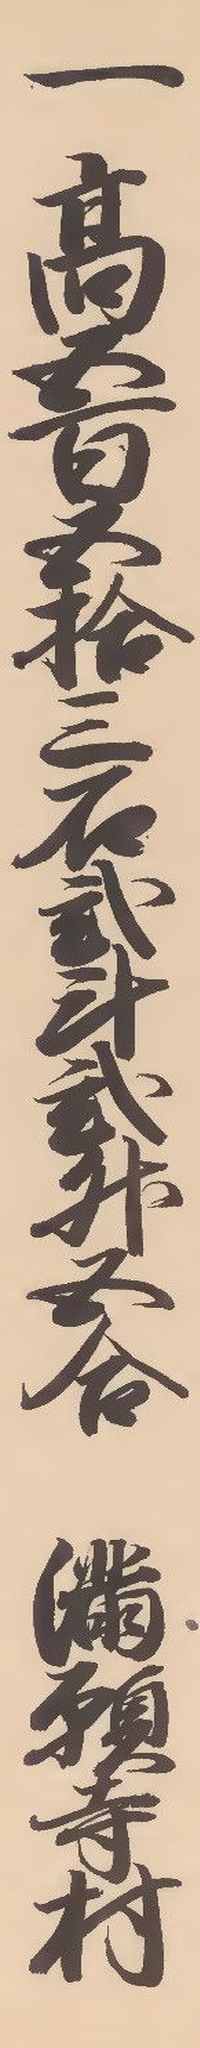一高五百五拾三石弐斗弐升五合満願寺村
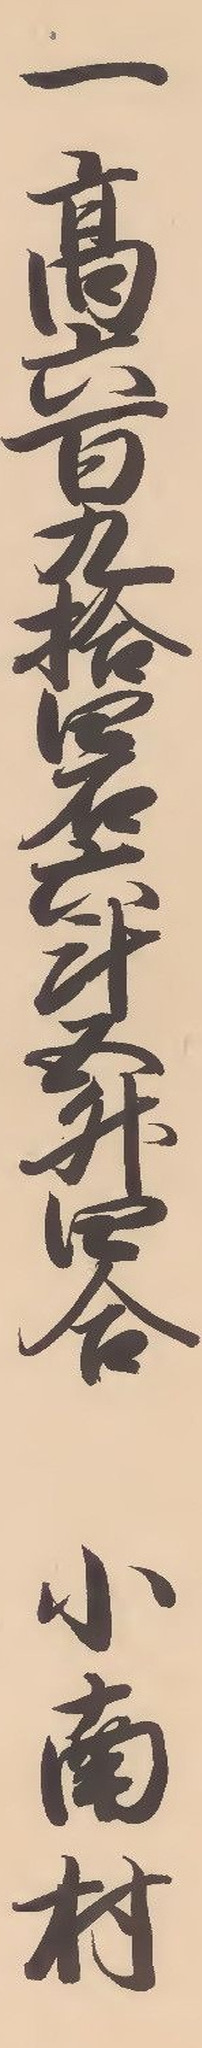一高六百九拾四石六斗五升四合小南村
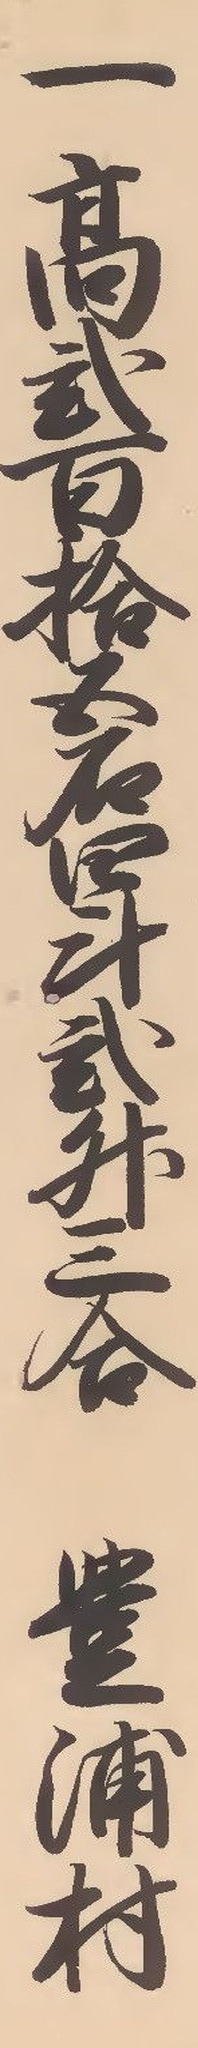一高弐百拾五石四斗弐升三合豊浦村
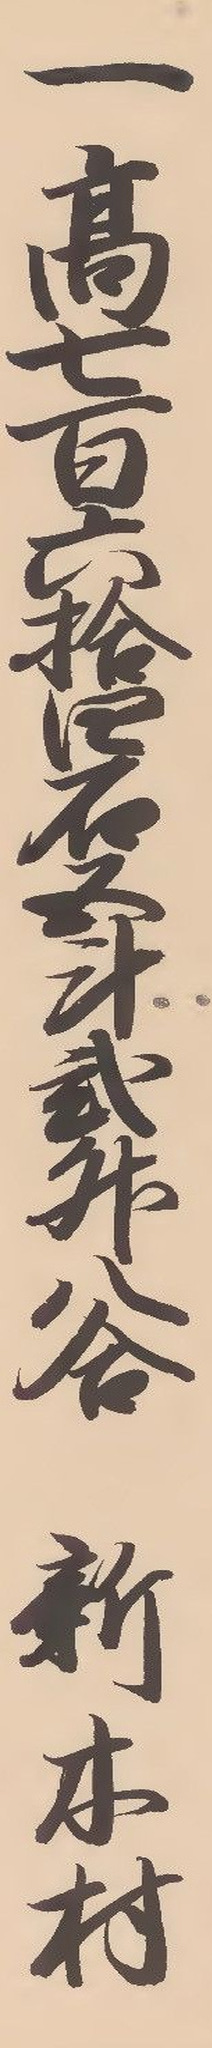一高七百六拾四石五斗弐升八合新木村
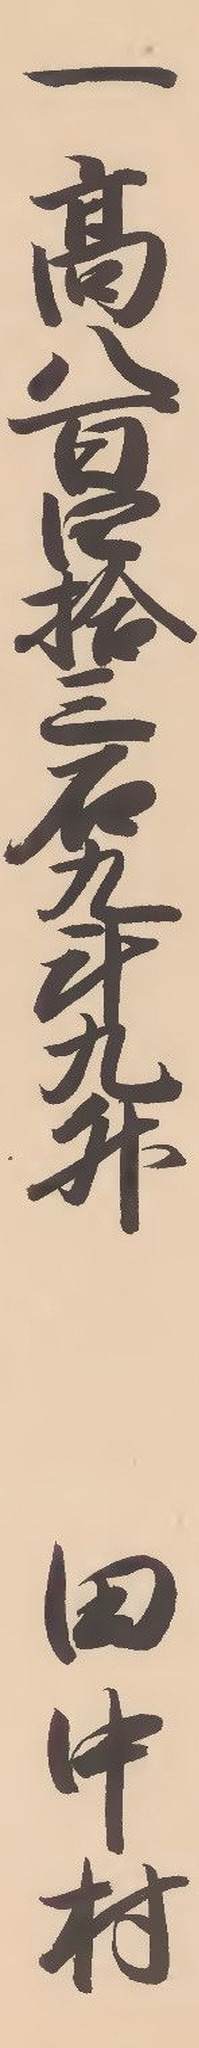一高八百四拾三石九斗九升田中村
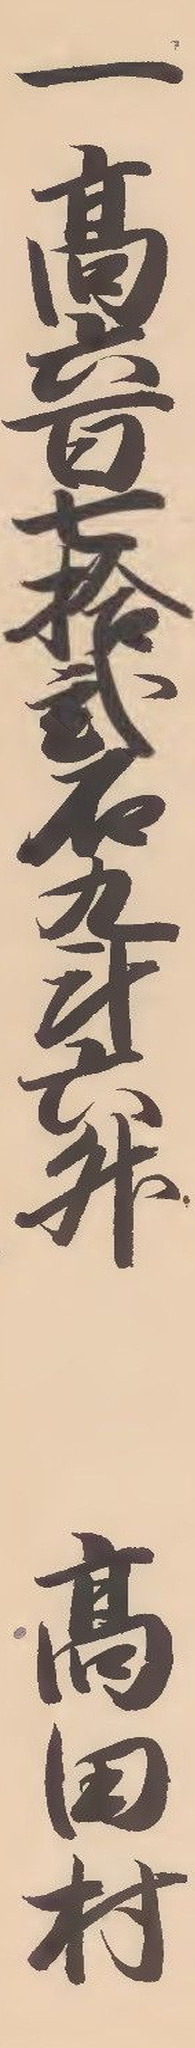一高六百七拾弐石九斗六升高田村
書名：大和国郷帳
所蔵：国立公文書館 National Archives of Japan
